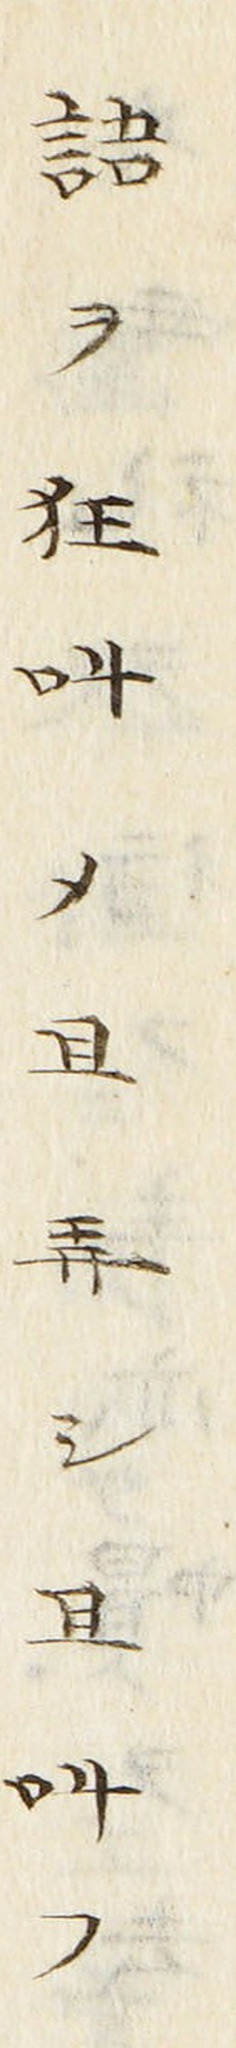其屍ヲ環シテ且弄シ且叫フ
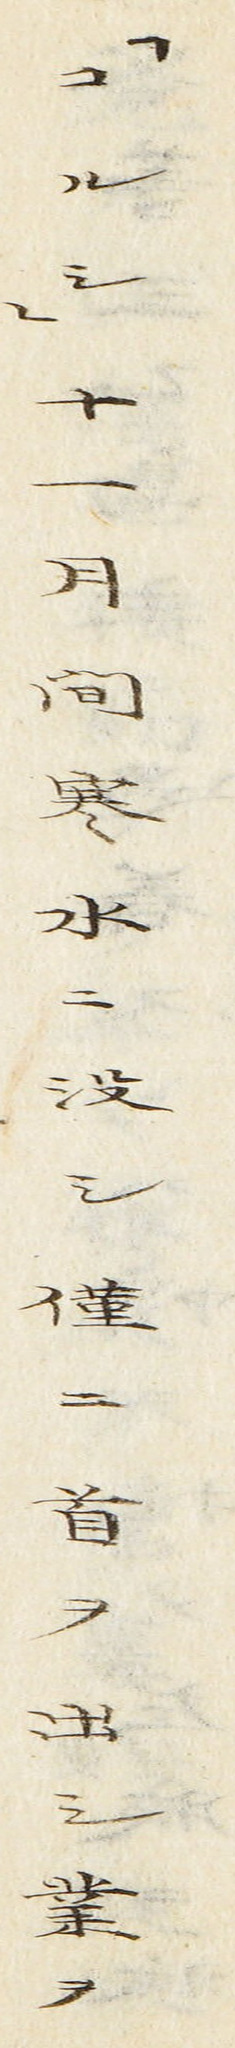〇「コルシ」十一月間寒水ニ没シ僅ニ首ヲ出シ業ヲ
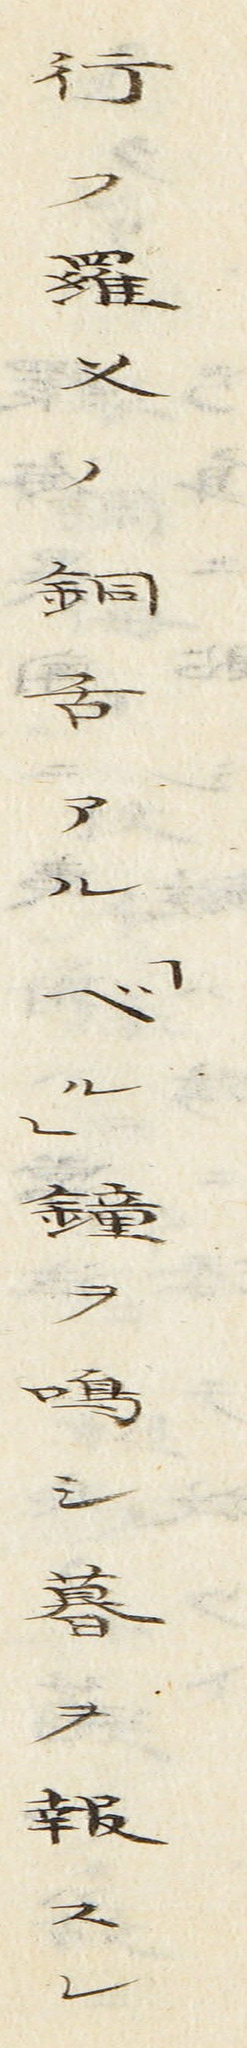行フ羅又ノ銅下舌アル「ベル」鐘ヲ鳴シ暮ヲ報スレ
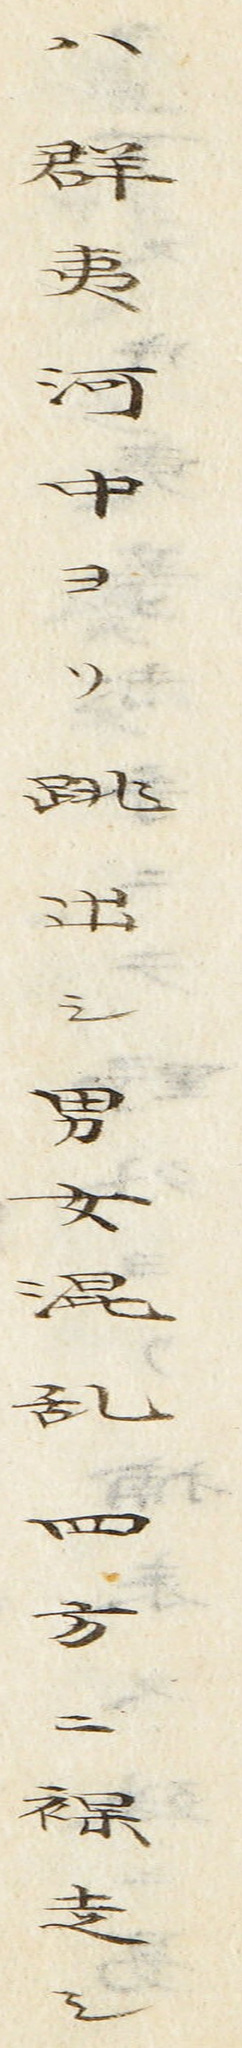ハ群夷河中ヨリ跳出シ男女混乱四方ニ踝走シ
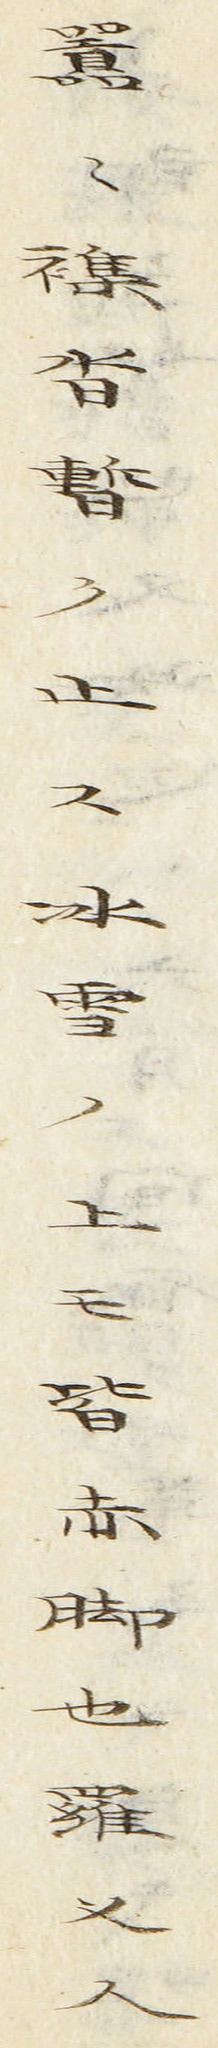囂々襍沓暫ク止ス氷雪ノ上モ皆赤脚也羅又？人
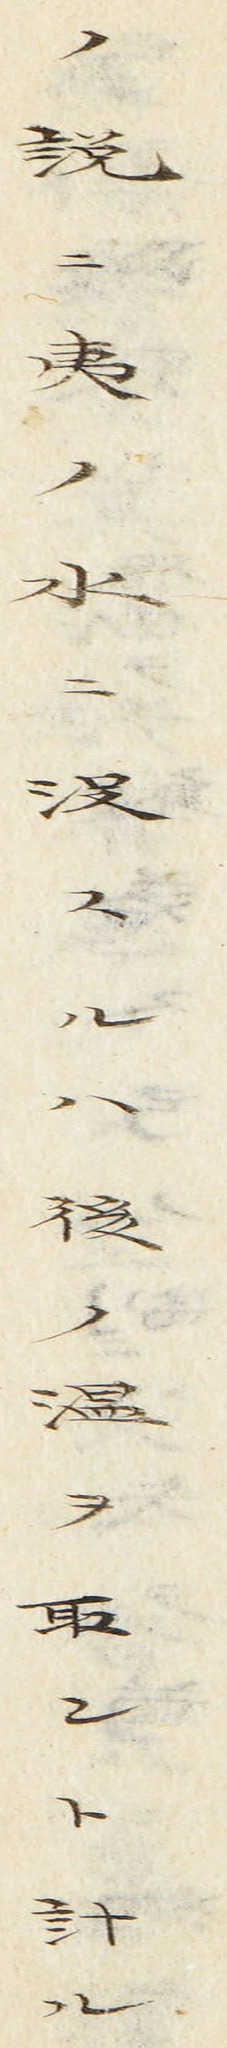ノ説ニ夷ノ水ニ没スルハ後ノ温ヲ取ント計ル

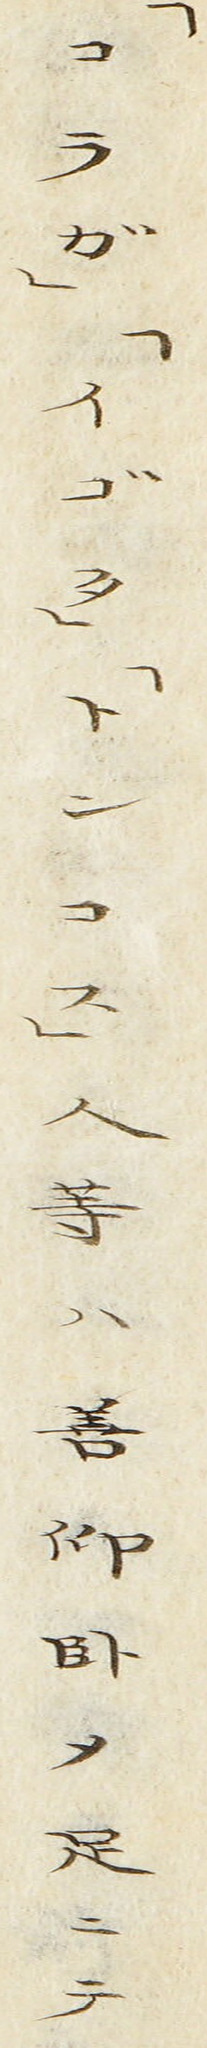〇「コラガ」「イゴタ」「トンコス」人等ハ善仰臥シテ足ニテ
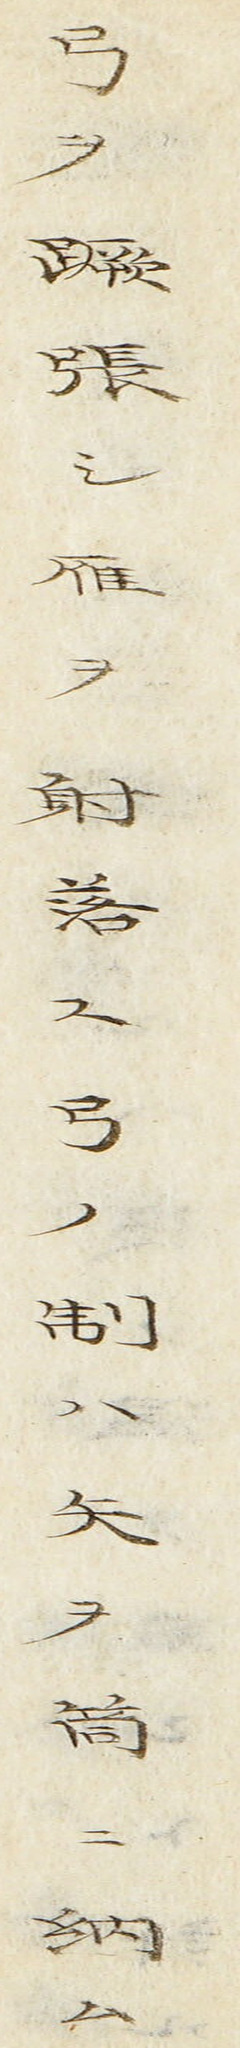弓ヲ蹶張シ雁ヲ射落ス弓ノ制ハ矢ヲ筒ニ納ム
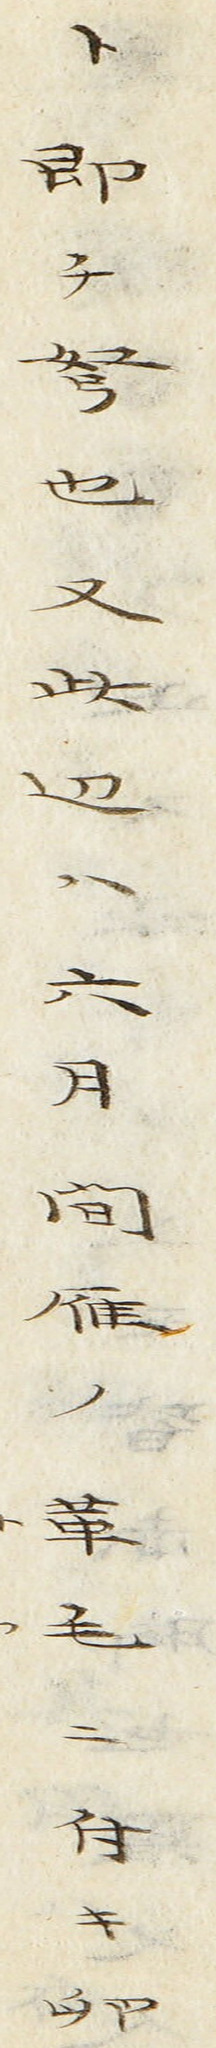ト即チ弩也又此辺ハ六月間雁ノ革毛ニ付キ卵
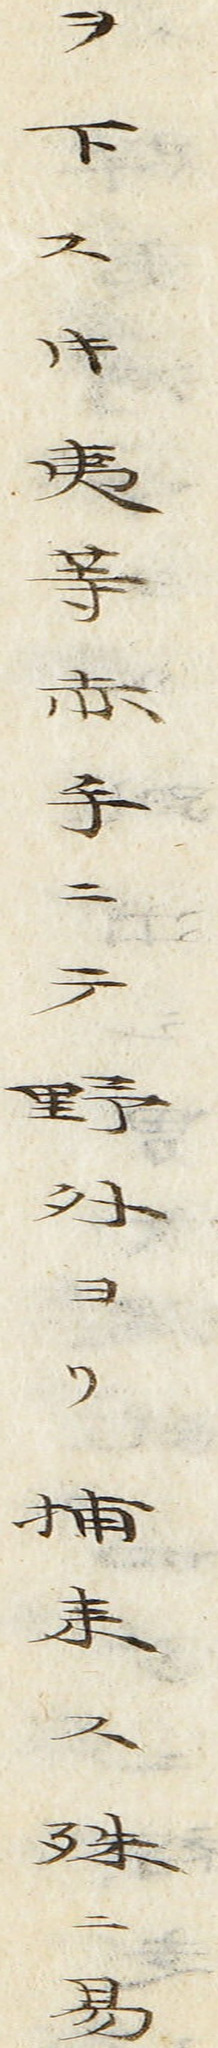ヲ下ストキ夷等亦赤手ニテ野外ヨリ捕来ス殊ニ易
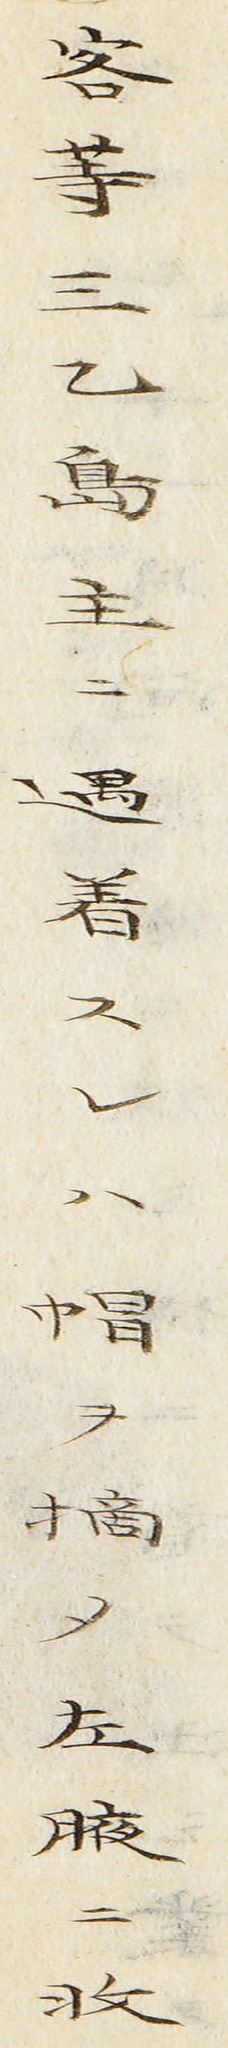〇客等三乙島主ニ遇着スレハ帽ヲ摘シテ左腋ニ収
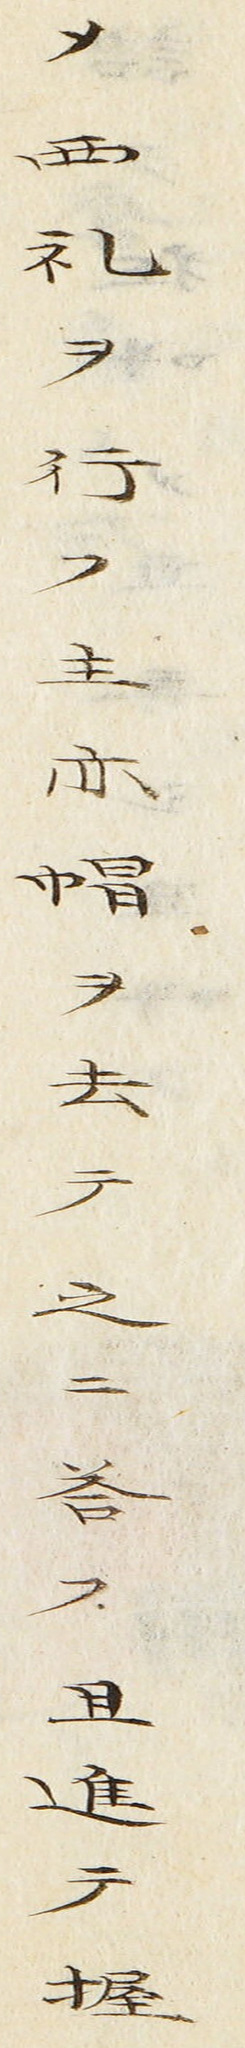シテ西礼ヲ行フ主亦帽ヲ去テ之ニ答フ且進テ握
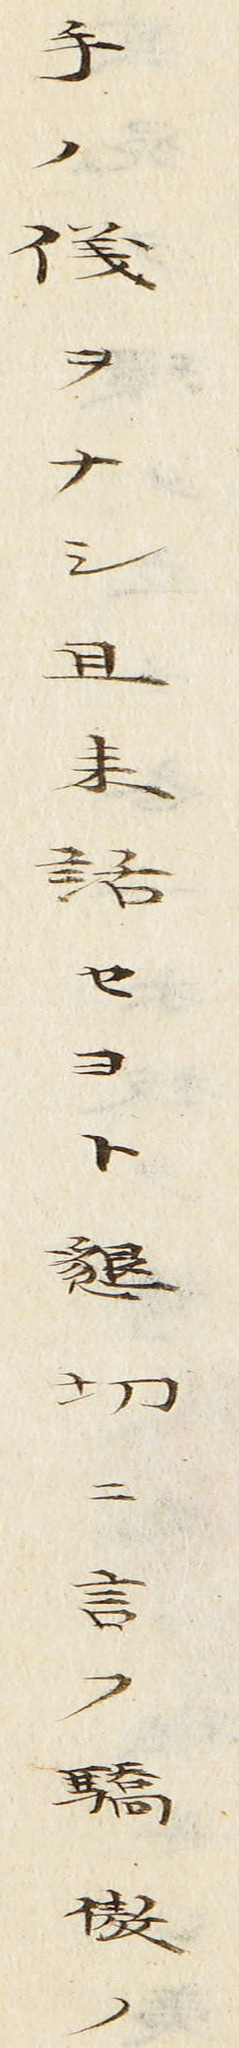手ノ儀ヲナシ且来話セヨト懇切ニ言フ驕傲ノ
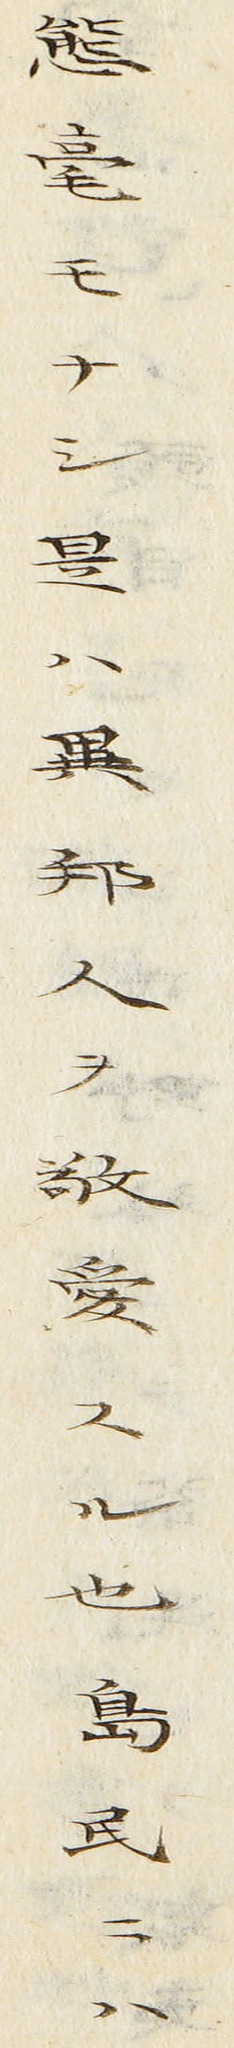態毫モナシ是ハ異邦人ヲ敬愛スル也島民ニハ
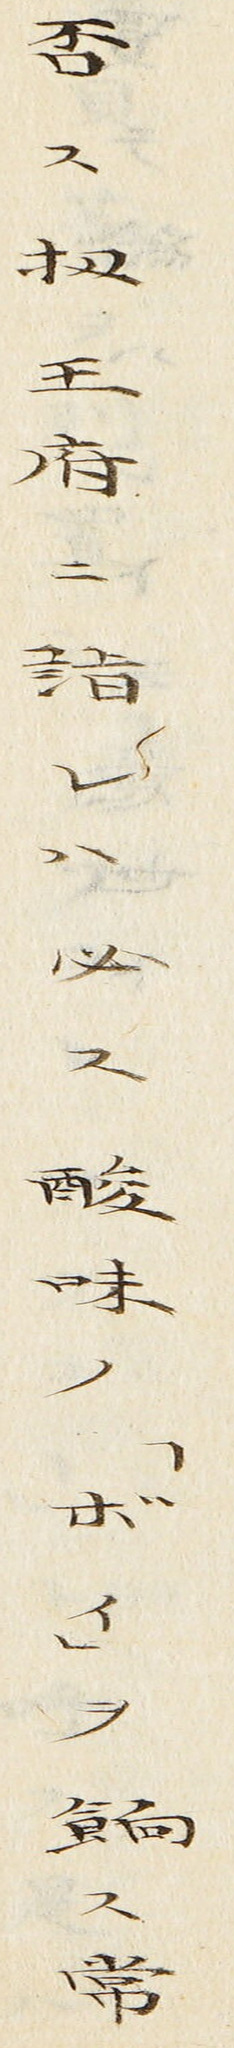否ス扨王府ニ詣レハ必ス酸味ノ「ボイ」ヲ餉ス常
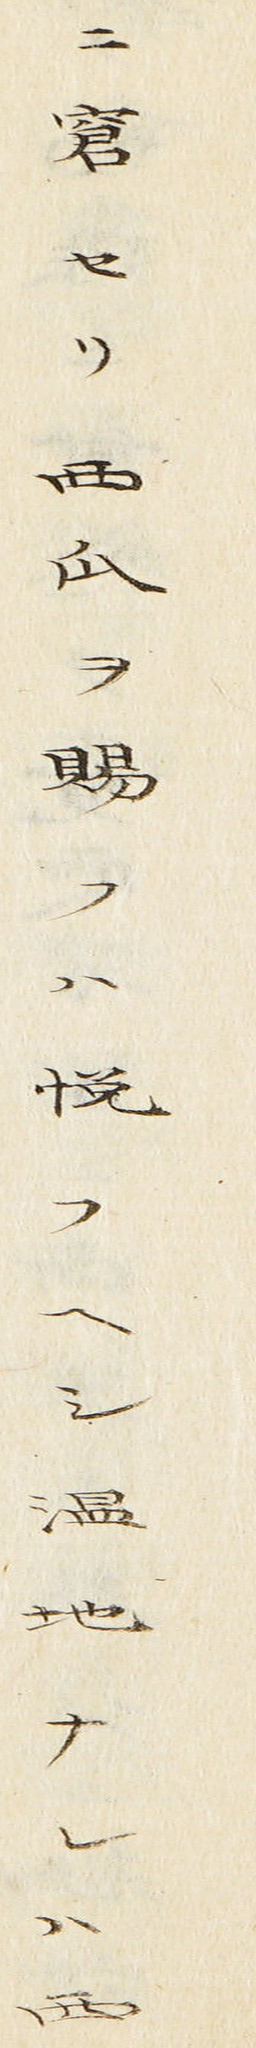ニ窘セリ西瓜ヲ賜フハ悦フヘシ温地ナレハ西
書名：蕃談
